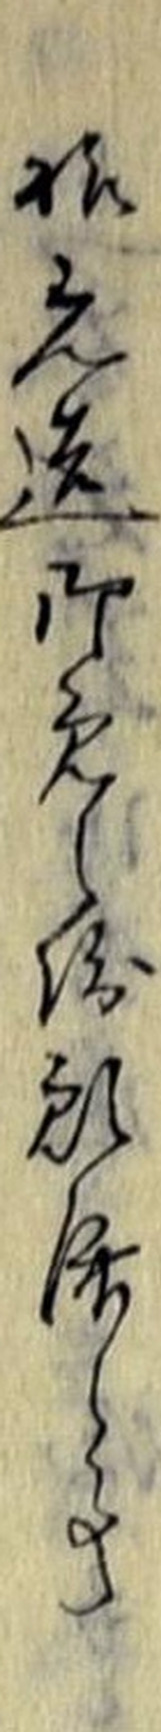様元造御免之儀願済之事
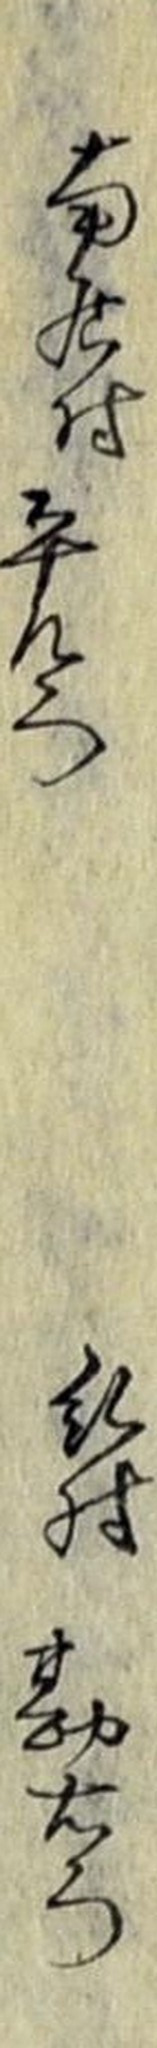南居村平左衛門糺村勘右衛門
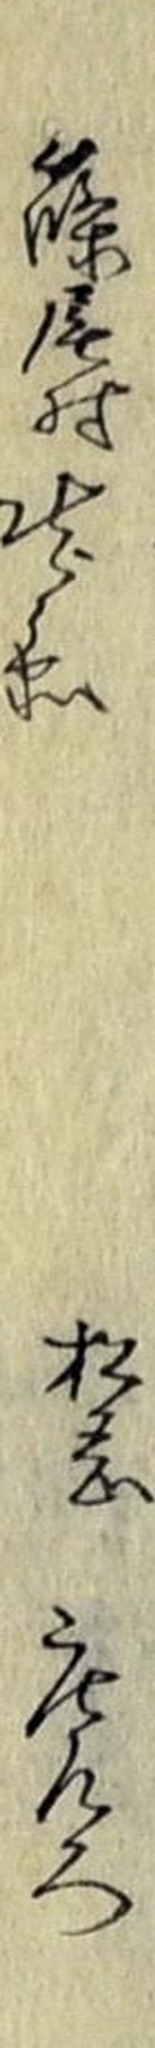篠尾村次郎兵衛松岡庄左衛門
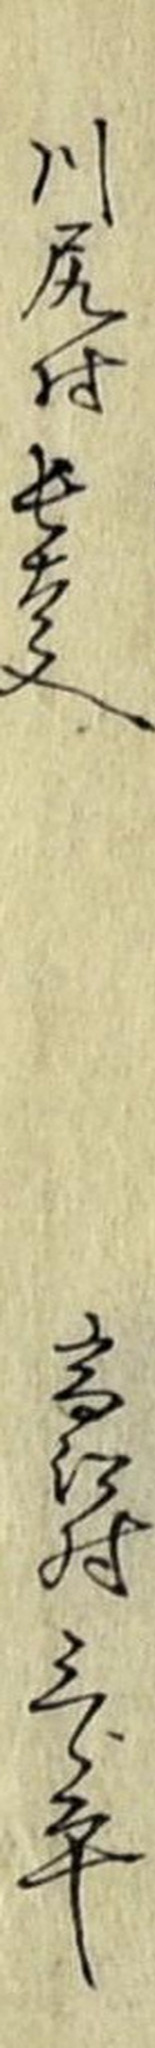川尻村長大夫高江村三郎平
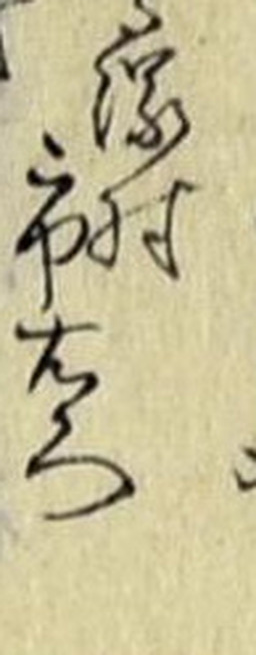市右衛門
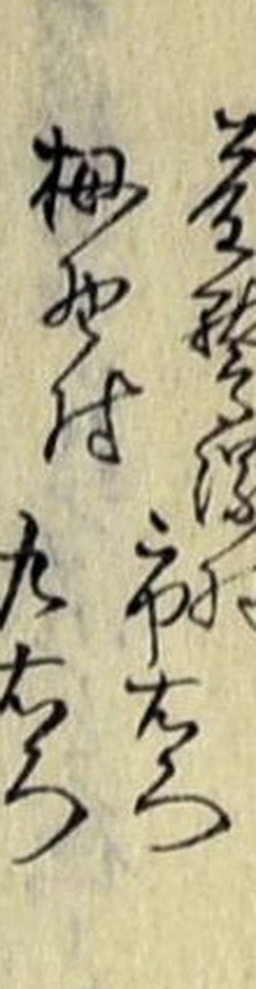栂野村九右衛門
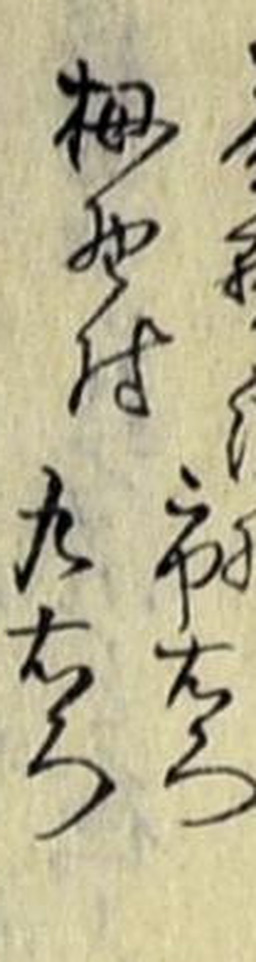栂野村九右衛門
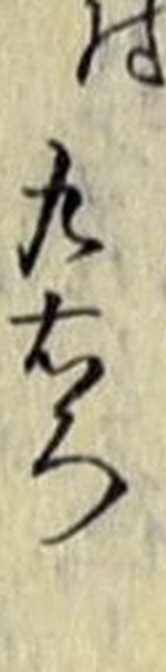市右衛門
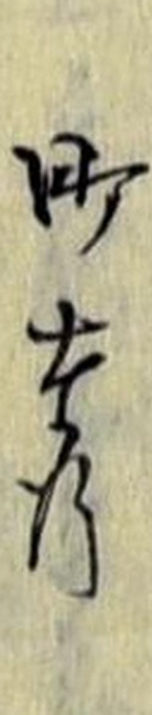町奉行
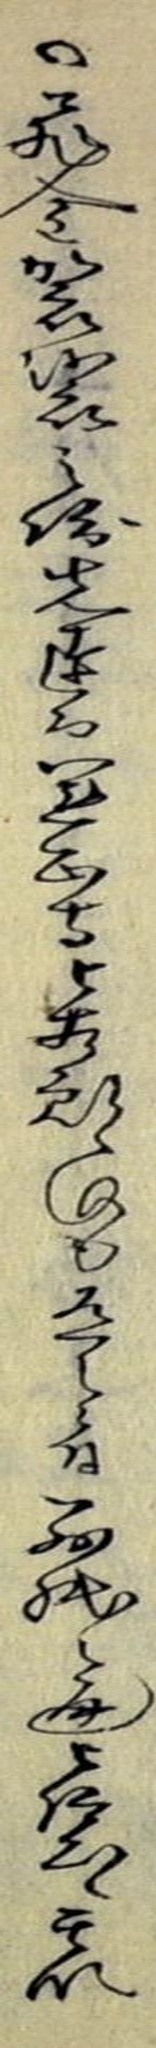○飛金袈裟之儀先達而運正寺被相願候趣も有之ニ付別紙之通被仰出候其段
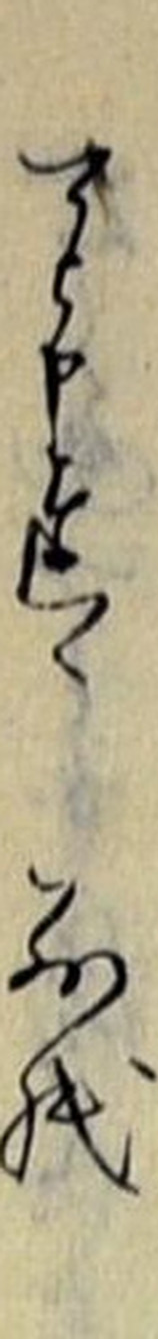可被申達候別紙
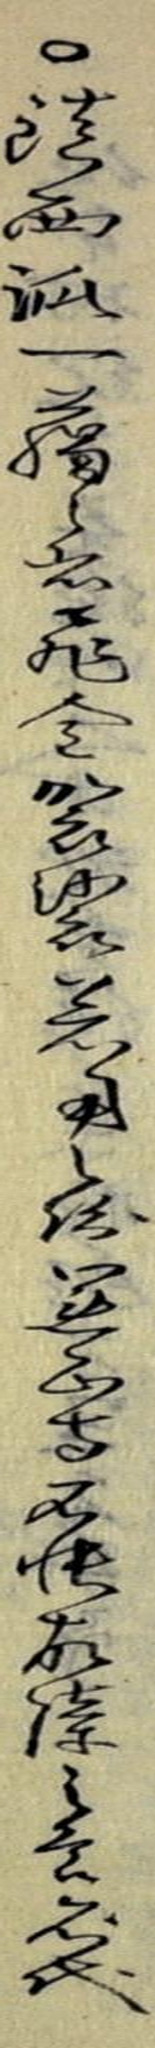○鎮西派一臈之者飛金袈裟着用之儀運正寺名帳故障之節名代
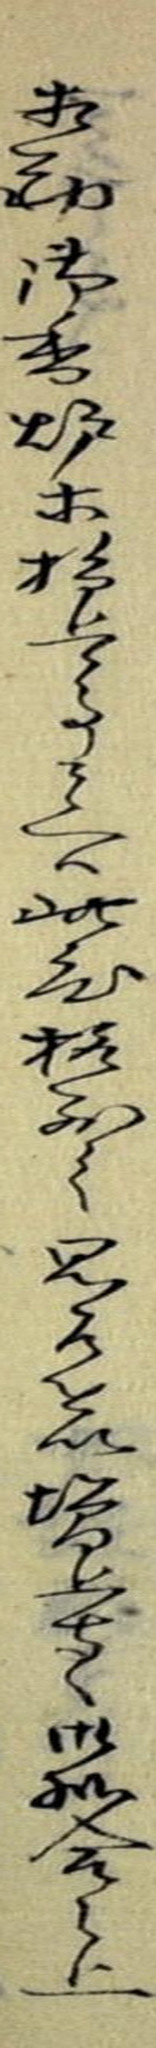相勤御香炉等指上候事ニ候へハ此度格別之思召を以増上寺へ御掛合之上
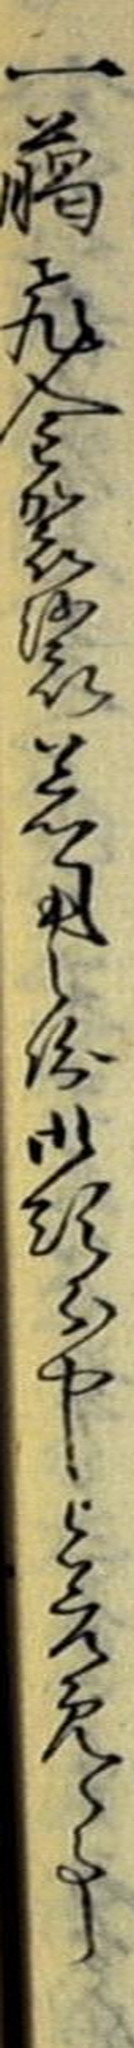一臈飛金袈裟着用之儀御領分中被差免候事
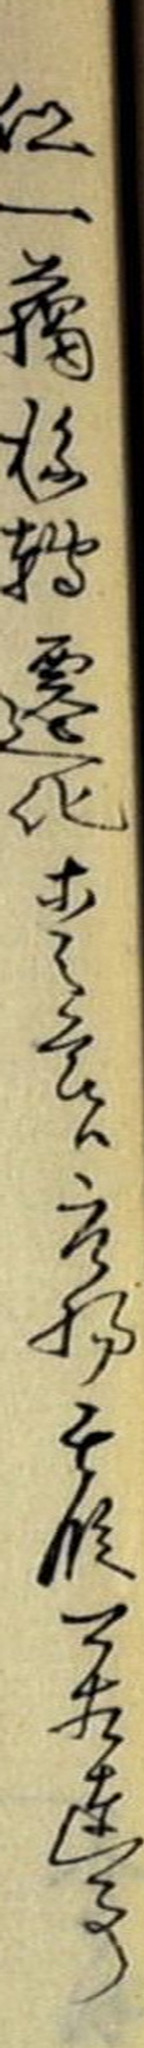但一臈移転遷化等之節ハ取揚其段可相達事
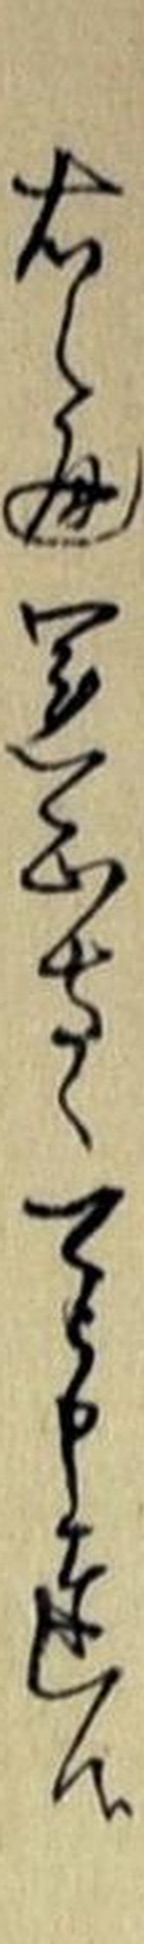右之通り運正寺へ可被申達候
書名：命令之部 五
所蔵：福井県文書館 Fukui Prefectural Archives
